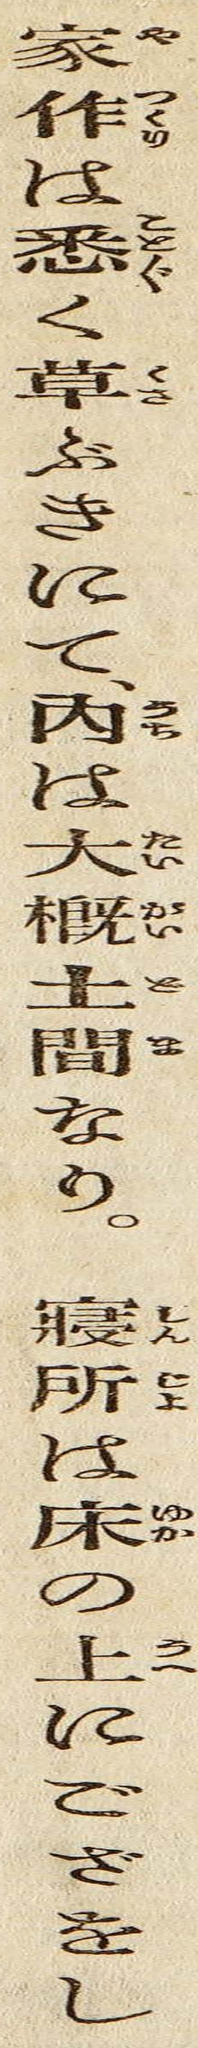家作は悉く草ぶきにて、内は大概土間なり。寝所は床の上にござをし
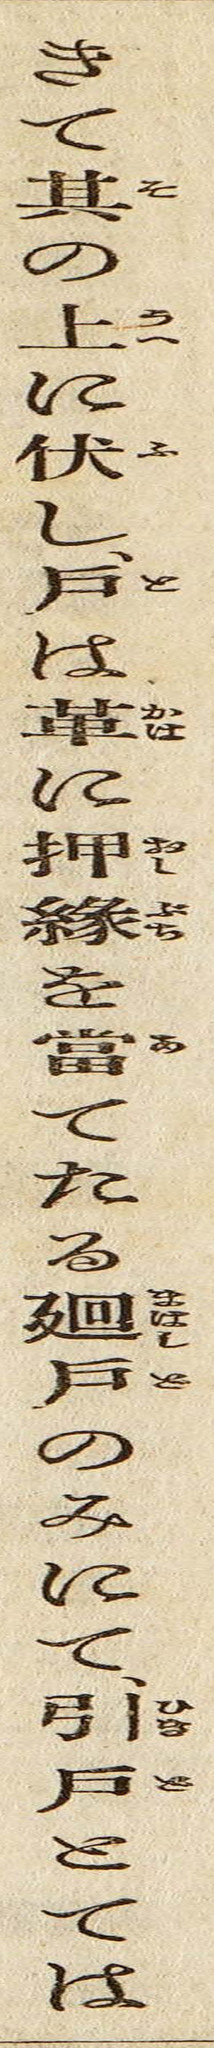きて其の上に伏し、戸は革に押縁を当てたる廻戸のみにて、引戸とては
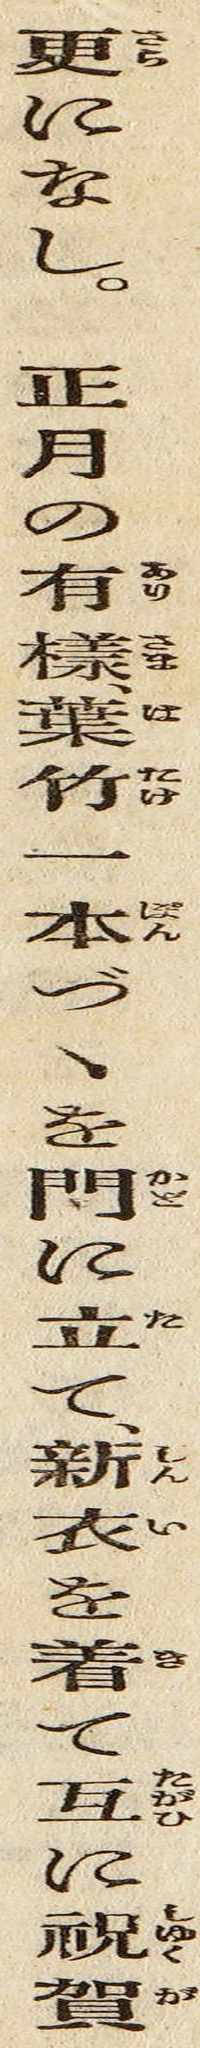更になし。正月の有様、葉竹一本づヽを門に立て、新衣を着て互に祝賀
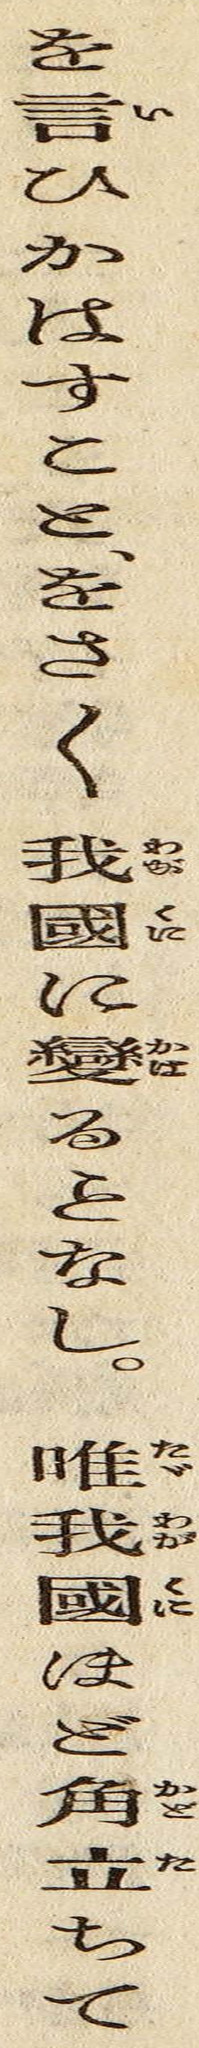を言ひかはすこと、をさ〳〵我国に変ることなし。唯我国ほど角立ちて
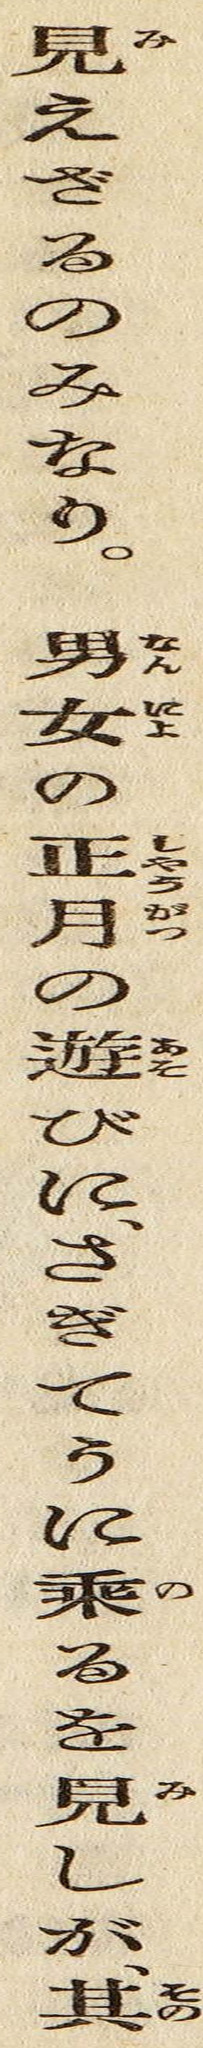見えざるのみなり。男女の正月の遊びに、さぎてうに乗るを見しが、其
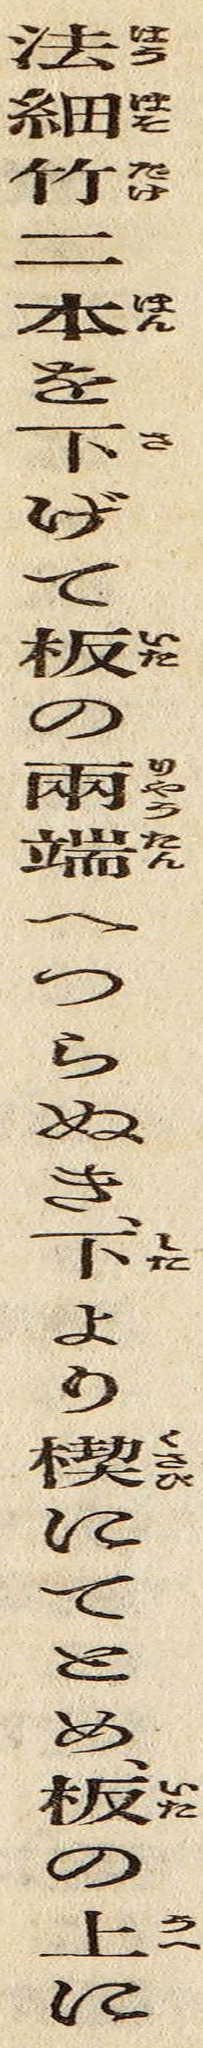法細竹二本を下げて板の両端へつらぬき、下より楔にてとめ、板の上に
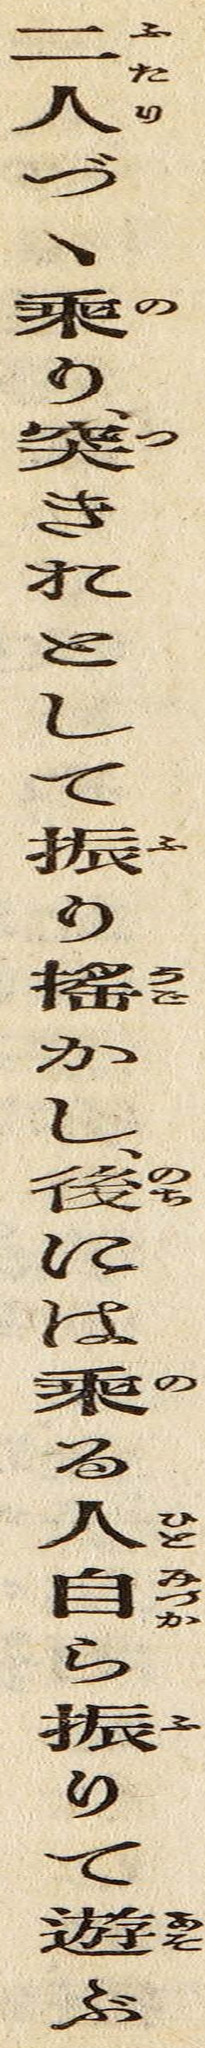二人づヽ乗り、突きおとして振り揺かし、後には乗る人自ら振りて遊ぶ
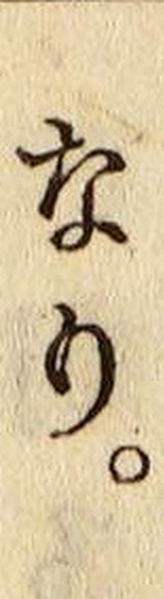なり。
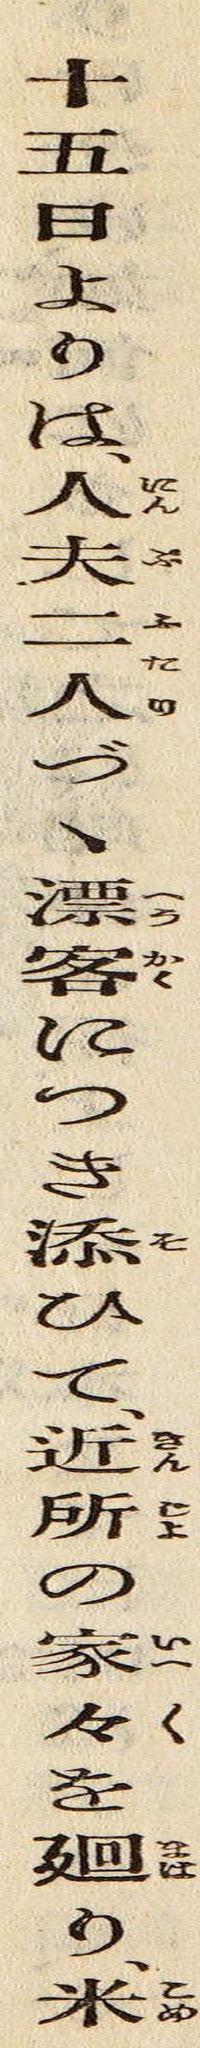十五日よりは、人夫二人づヽ漂客につき添ひて、近所の家々を廻り、米
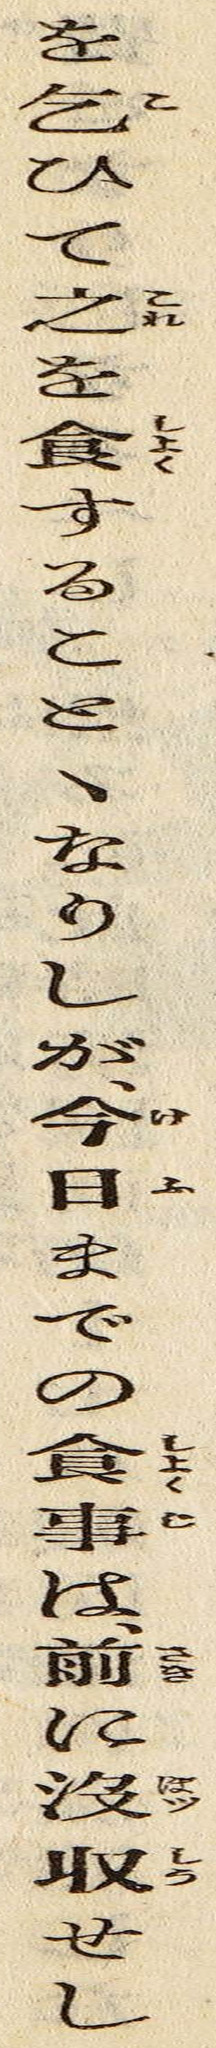を乞ひて之を食することヽなりしが、今日までの食事は、前に没収せし
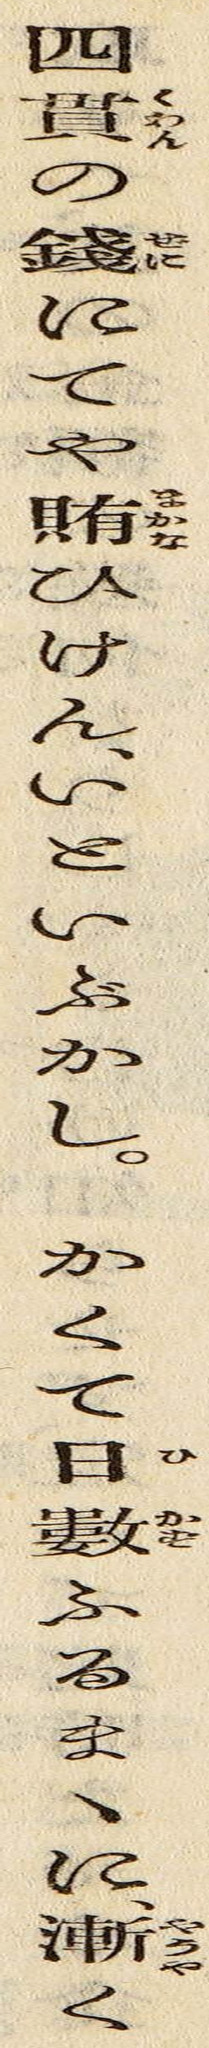四貫の銭にてや賄ひけん、いといぶかし。かくて日数ふるまヽに、漸く
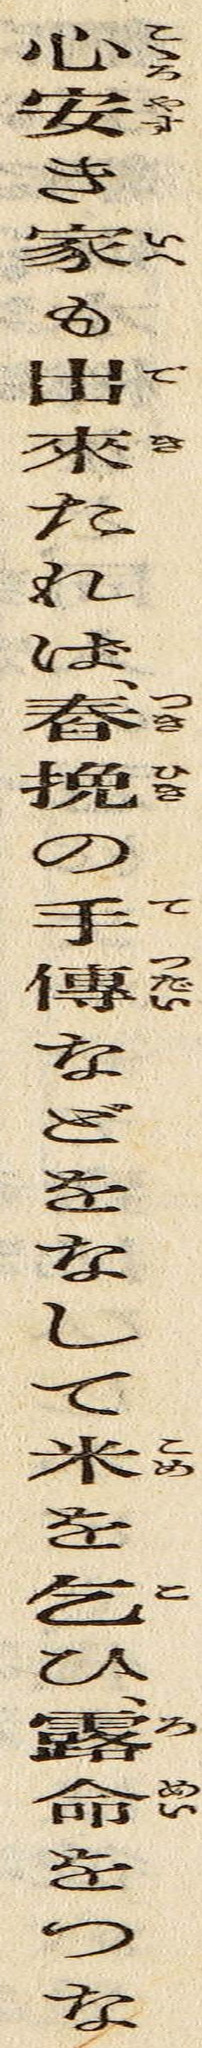心安き家も出来たれば、舂挽の手伝などをなして米を乞ひ、露命をつな
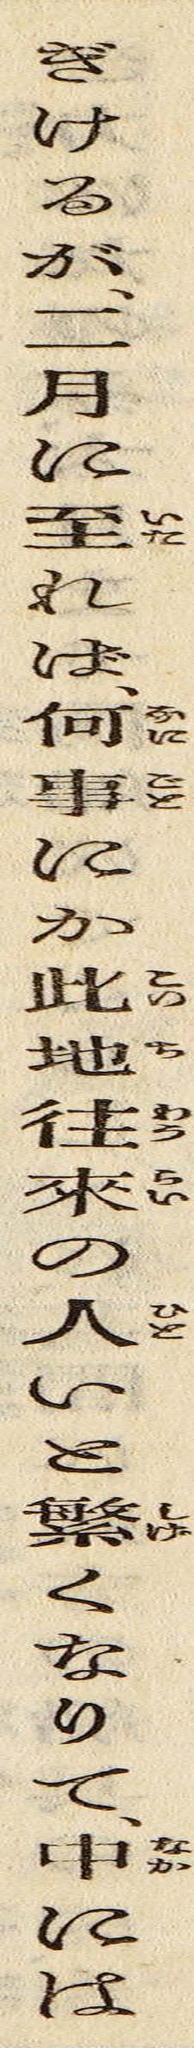ぎけるが、二月に至れば、何事にか此地往来の人いと繁くなりて、中には
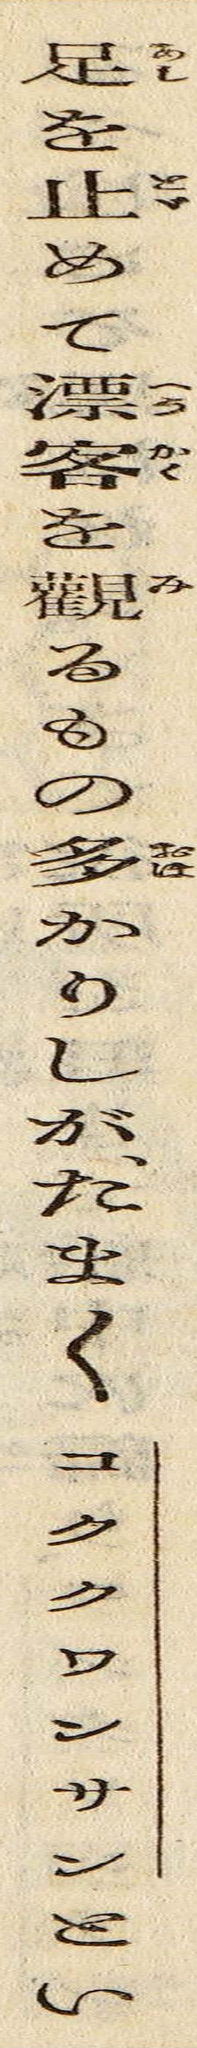足を止めて漂客を観るもの多かりしが、たま〳〵コククワンサンとい
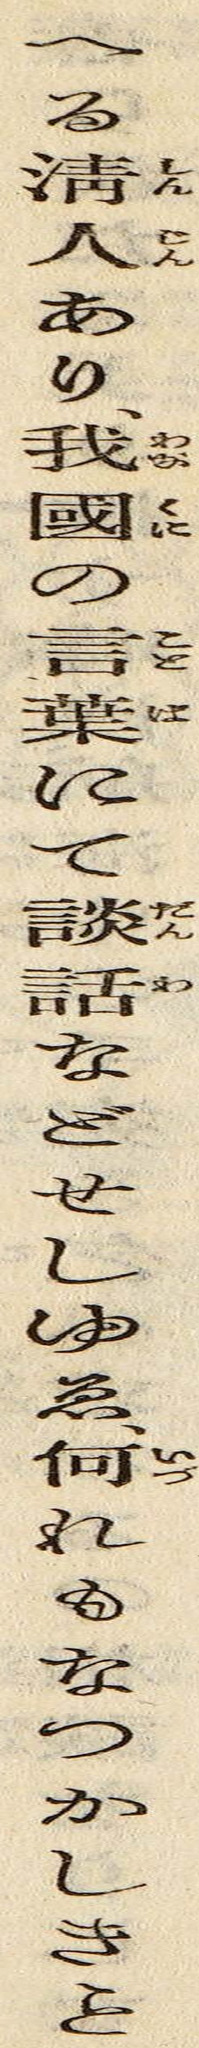へる清人あり、我国の言葉にて談話などせしゆゑ、何れもなつかしきこと
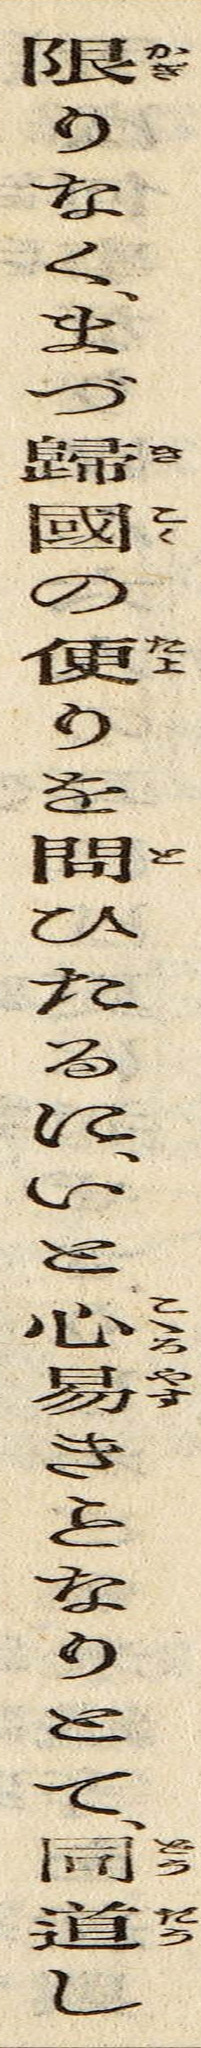限りなく、まづ帰国の便りを問ひたるに、いと心易きことなりとて、同道し
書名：日本漂流譚
